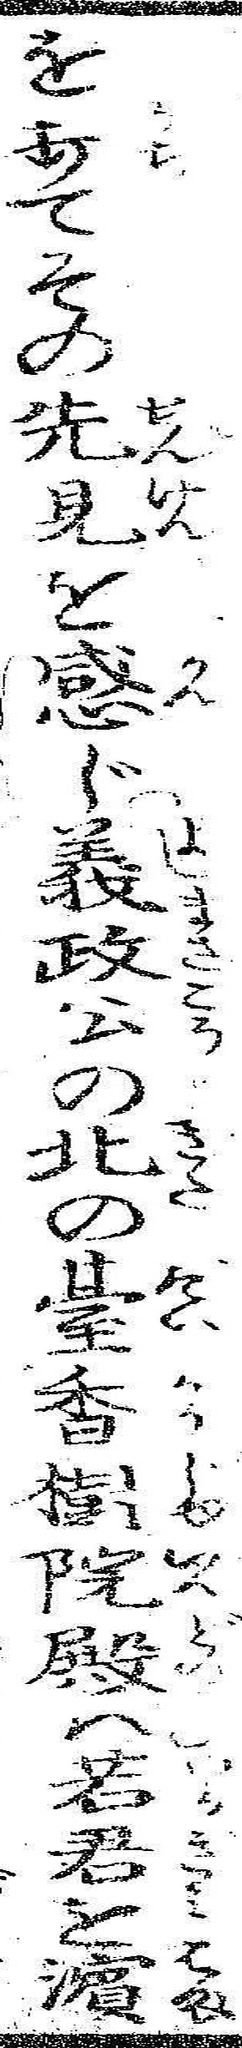を打てその先見を感じ。義政公の北の台香樹院殿は。若君を浜
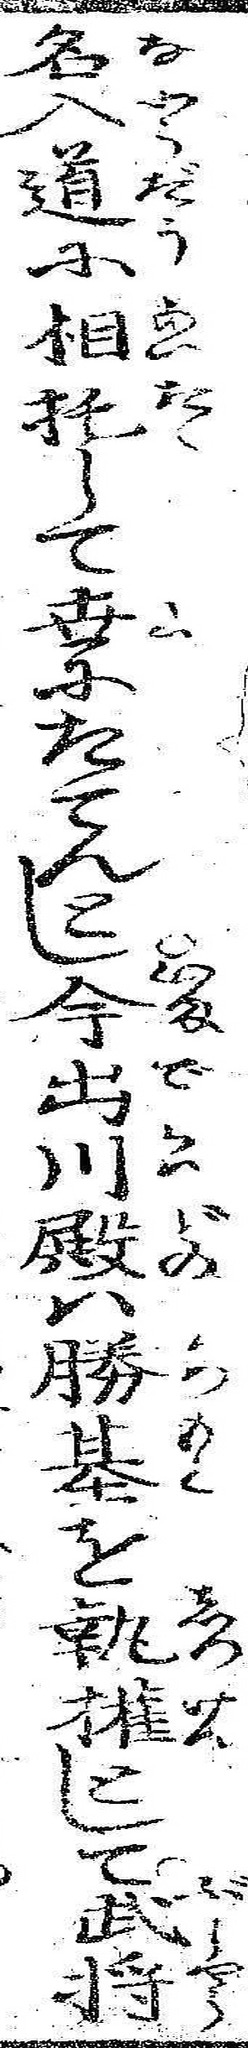名入道に相托して世にたてんとし。今出川殿は勝基を執権として。武将
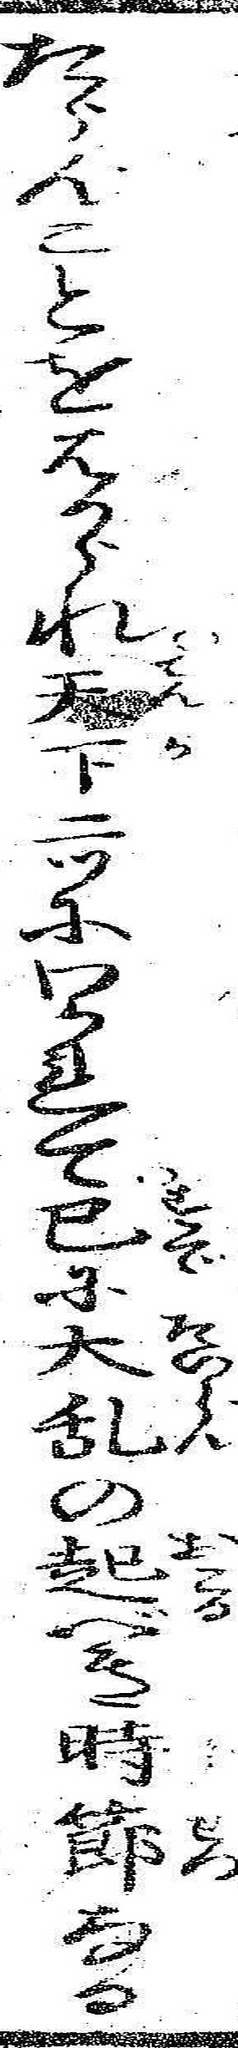たらんことをはかられ。天下二ツにわかれて。已に大乱の起べき時節なる

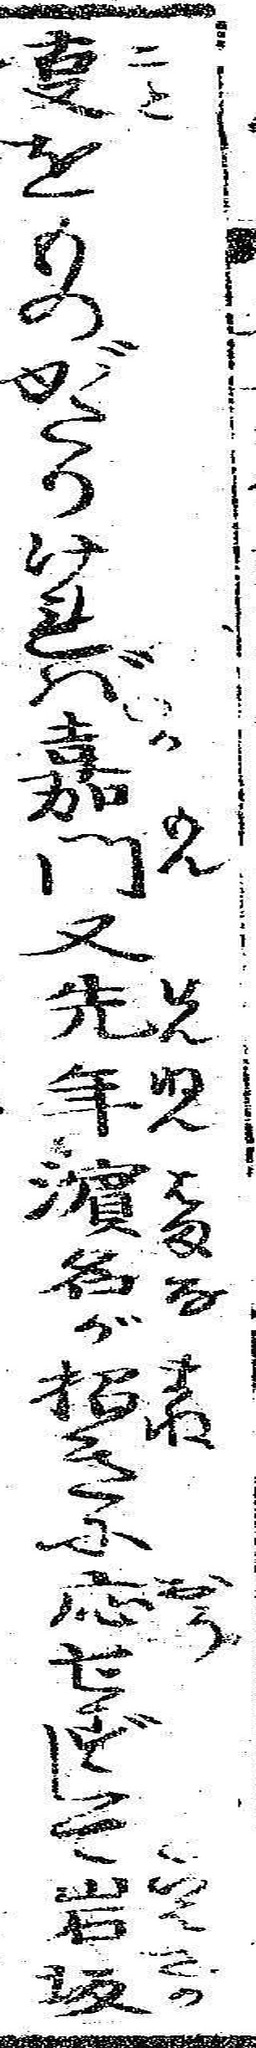事をものがたりければ。嘉門又先年浜名が招きに応せずして。岩坂
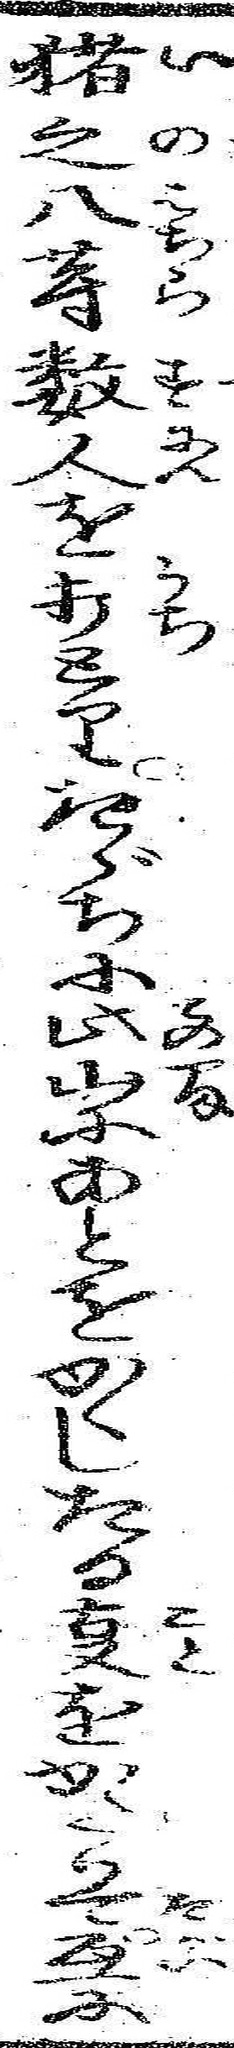猪之八等数人を打とり。たゞちに此山にあとをかくしたる事をかたりて。互に
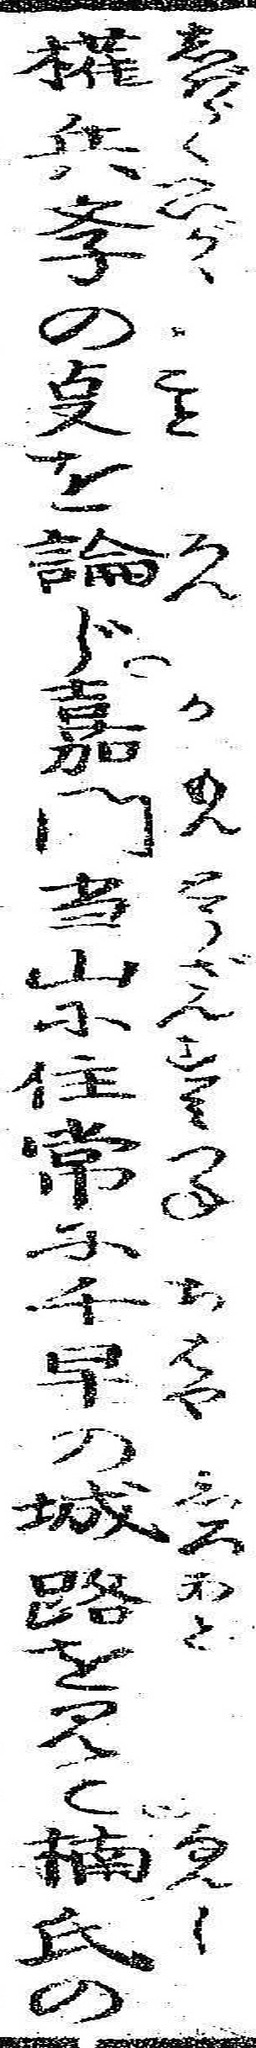権兵学の事を論じ。嘉門当山に住常に千早の城路を見て。楠氏の
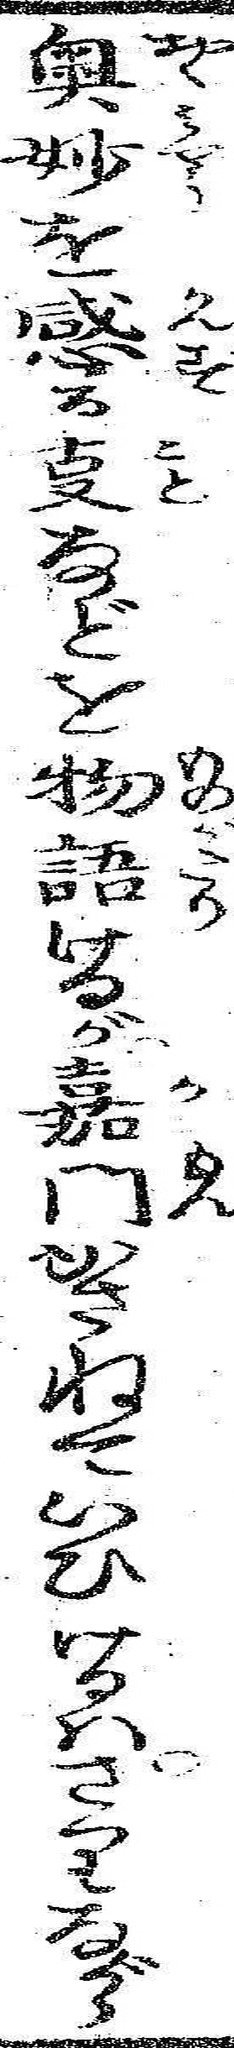奥妙を感る事などを物語けるが。嘉門かさねていひけるは。さりながら
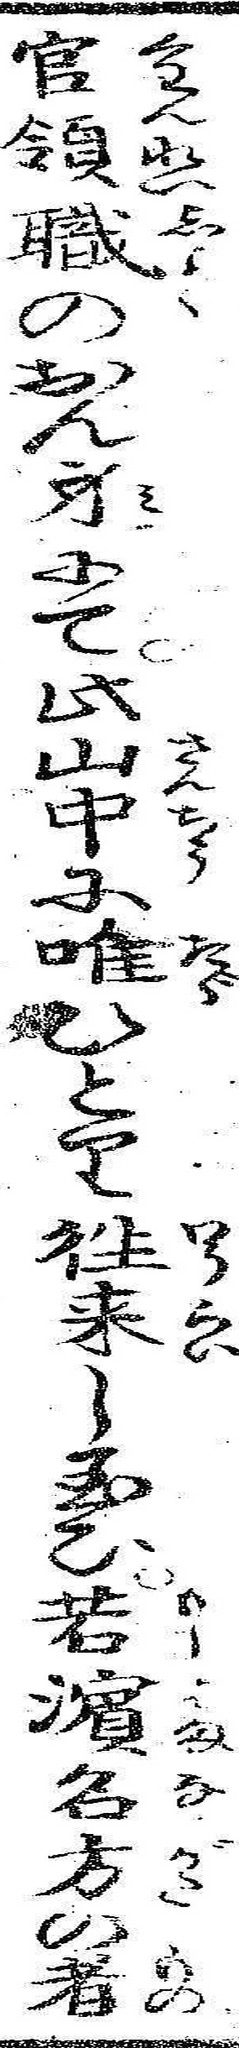官領職のおん身にて。此山中に唯ひとり往来し玉ひ。若浜名方の者
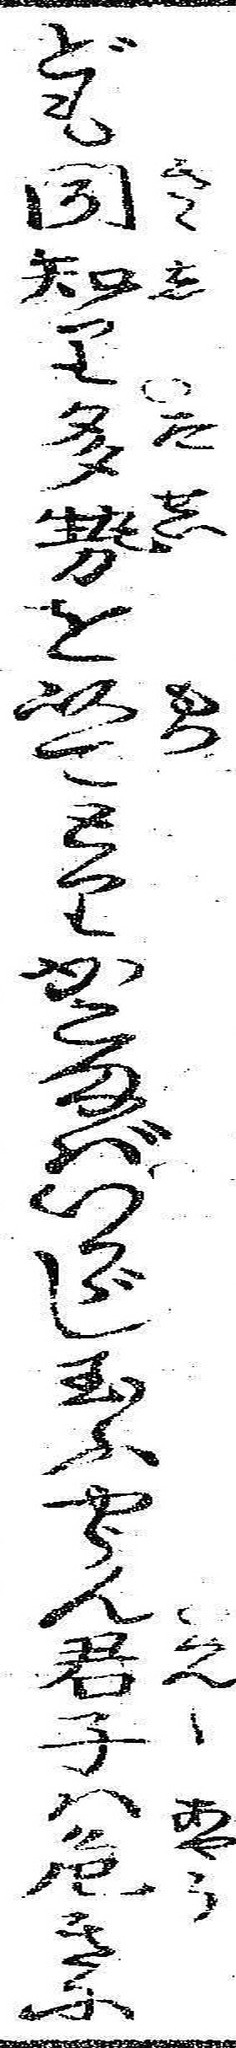ども聞知り。多勢を以てとりかこまば。いかゞし玉ふやらん。君子は危きに
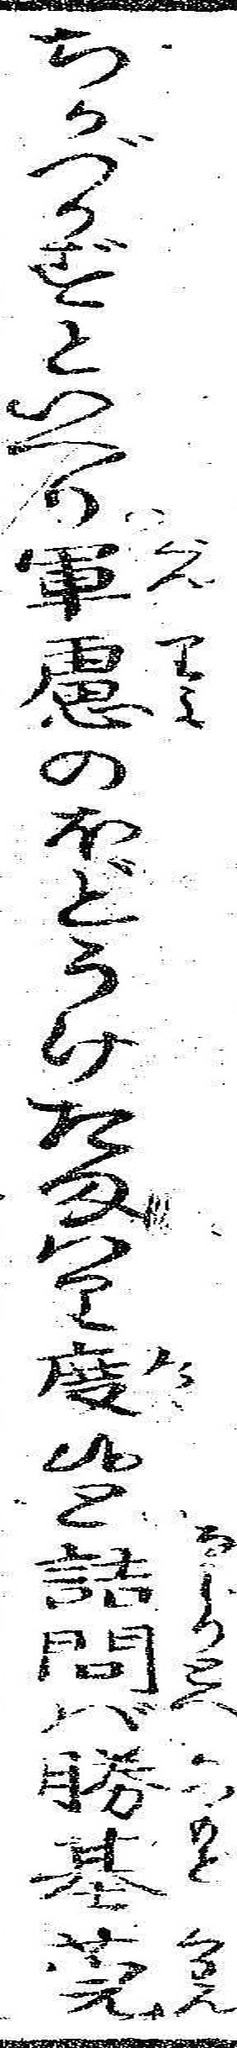ちかづかずといへり。軍慮のほどうけたまはり度候と。詰問ば勝基莞
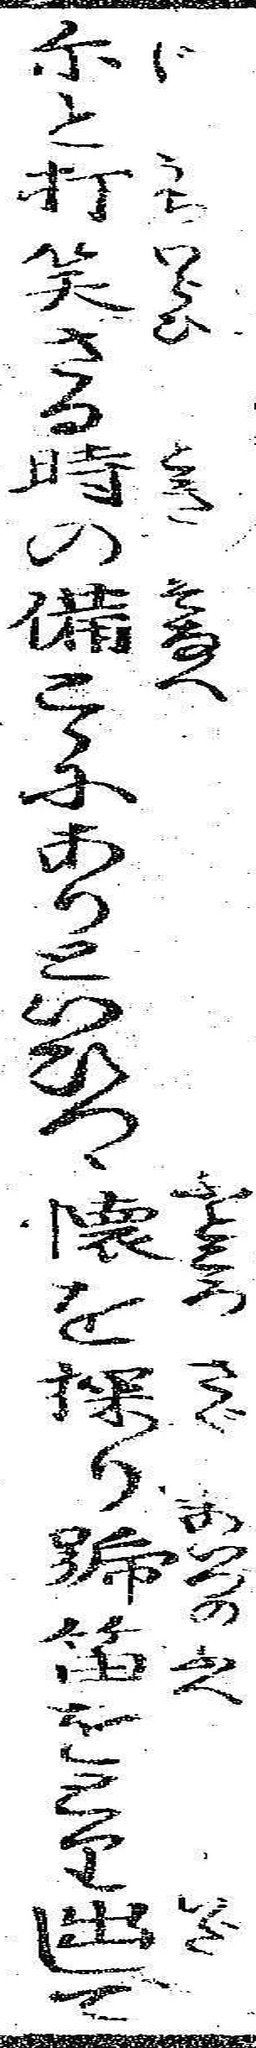爾と打笑さる時の備こゝにありといひつゝ懐を探り。号笛をとり出して
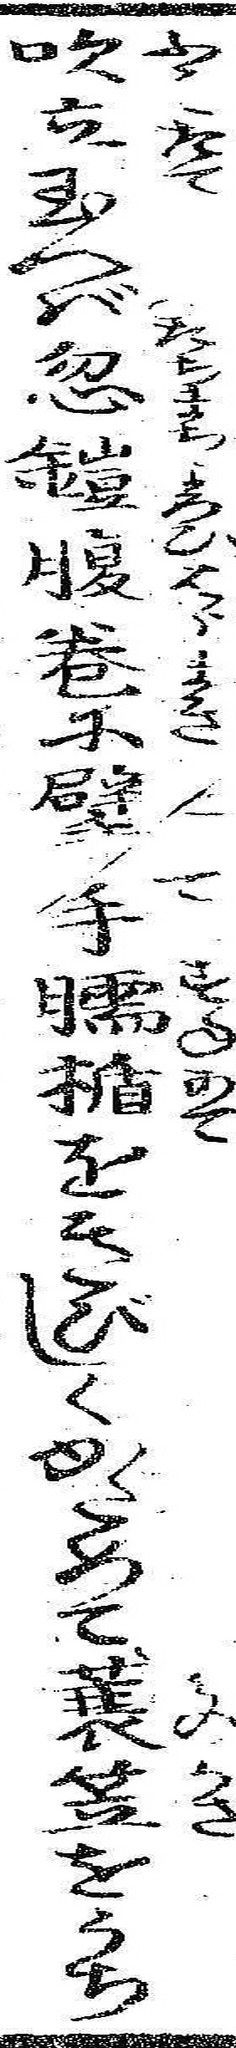吹立玉へば。忽鎧腹巻に擘手臑楯をきびしくかためて。蓑笠をうち
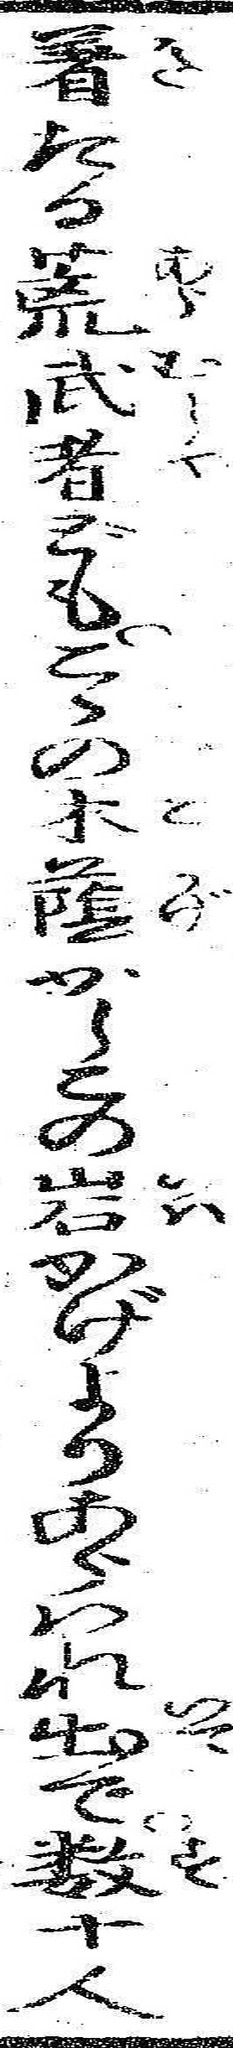着たる荒武者ども。こゝの木蔭かしこの岩かげよりあらはれ出で。数十人
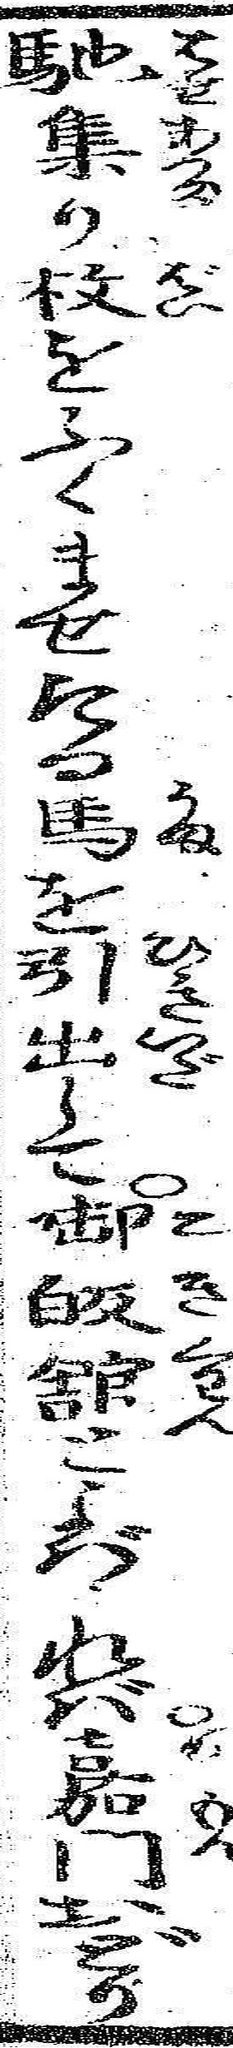馳集り。枚をふくませたる馬を引出して。御帰館とよばゝれば。嘉門おどり
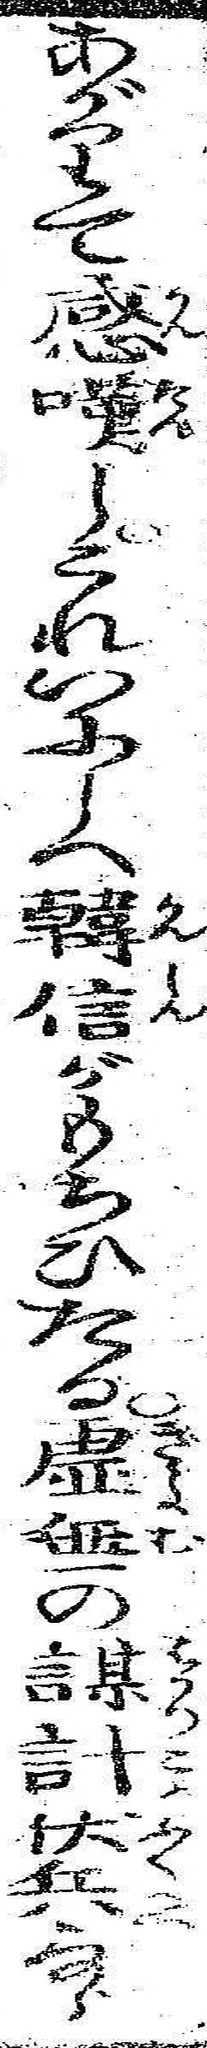あがりて感嘆し。これいにしへ韓信がもちひたる。虚無の謀計伏兵なら
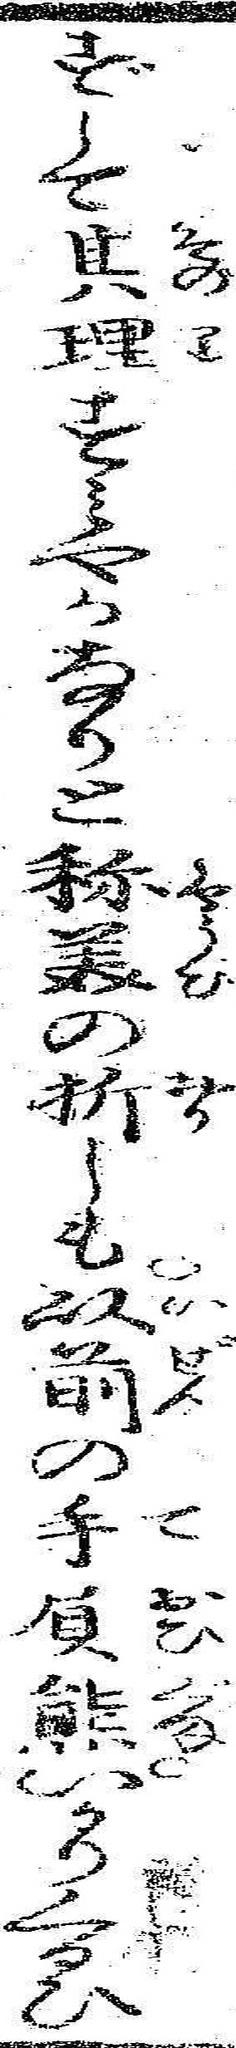ずして其理すみやかなりと称美の折しも。以前の手負熊。いかりくるひ
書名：昔話稲妻表紙
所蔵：国文学研究資料館
